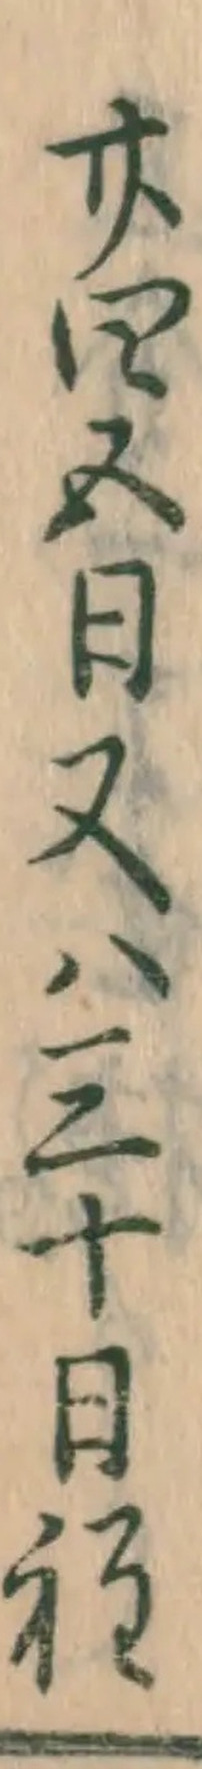廿四五日又は三十日程
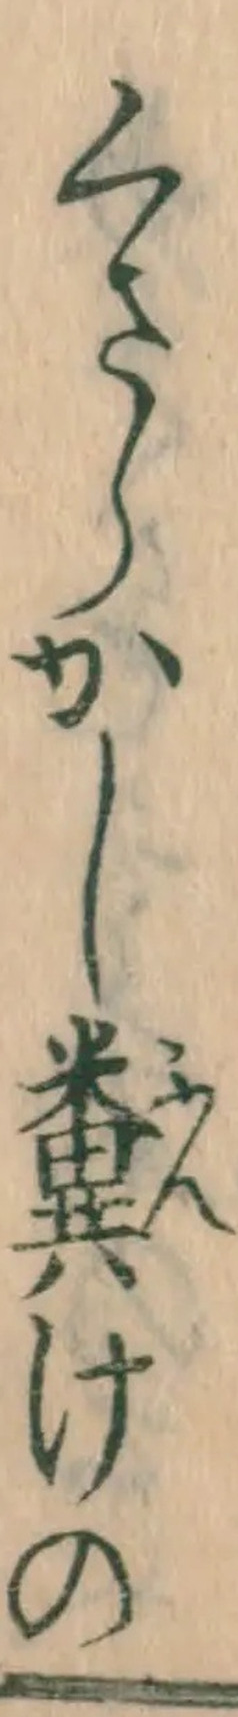くさらかし糞けの
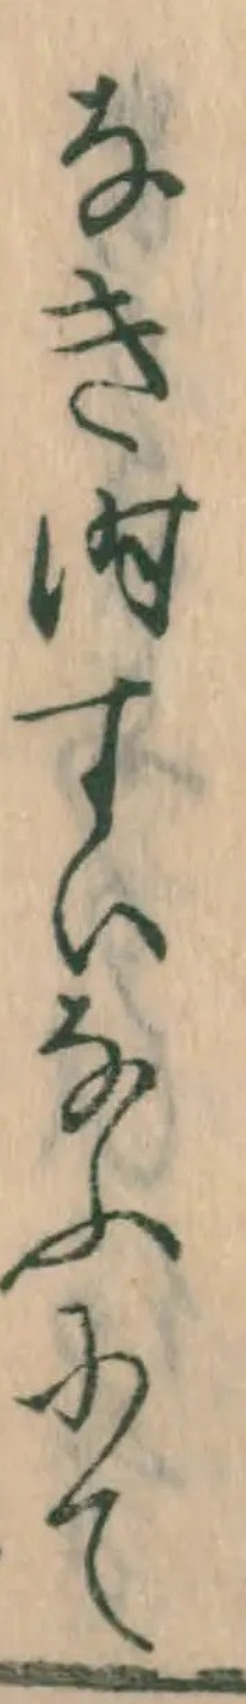なき時すいなふにて
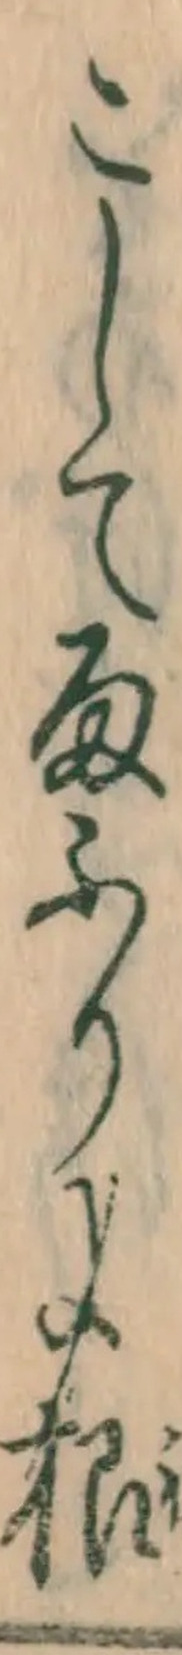こして雨ふりに根
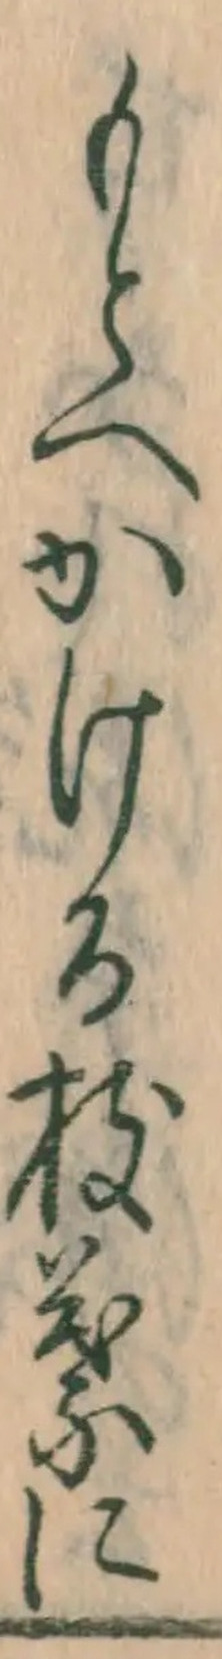もとへかける枝葉に
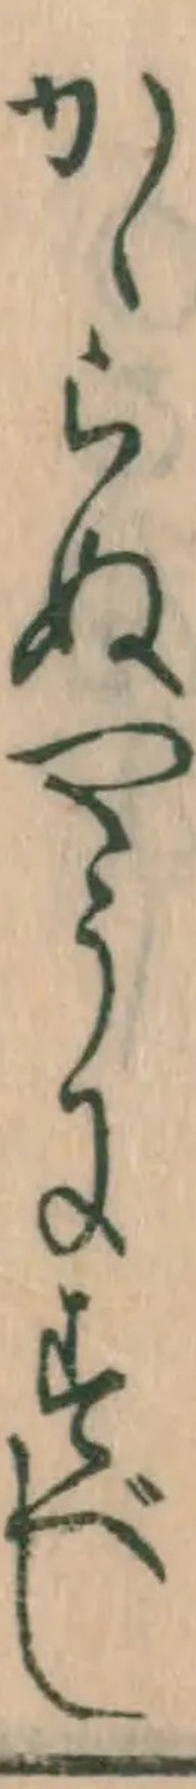かゝらぬやうにすべし
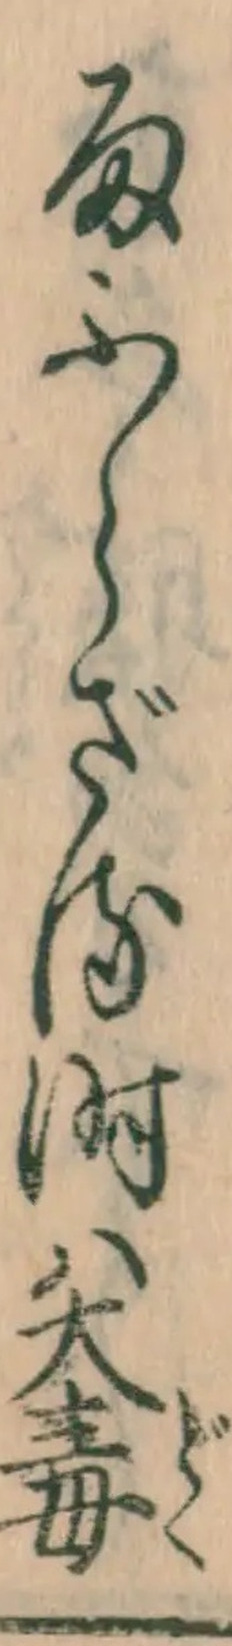雨ふらざる時は大毒
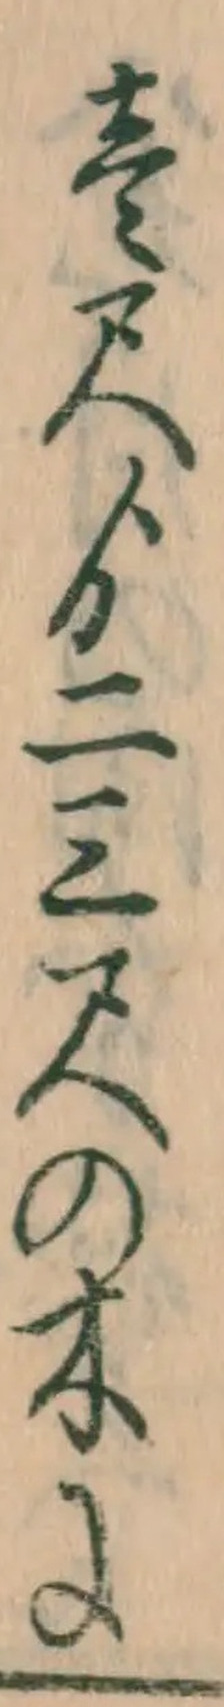壱尺ゟ二三尺の木に
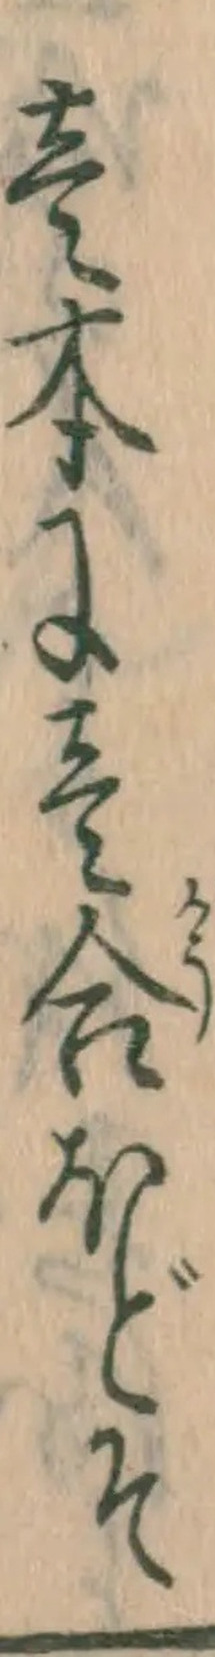壱本に壱合ほどそ
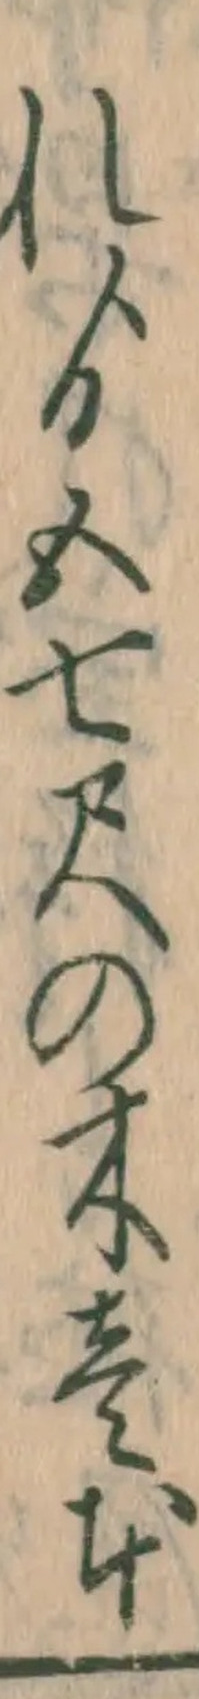れゟ五七尺の木壱本
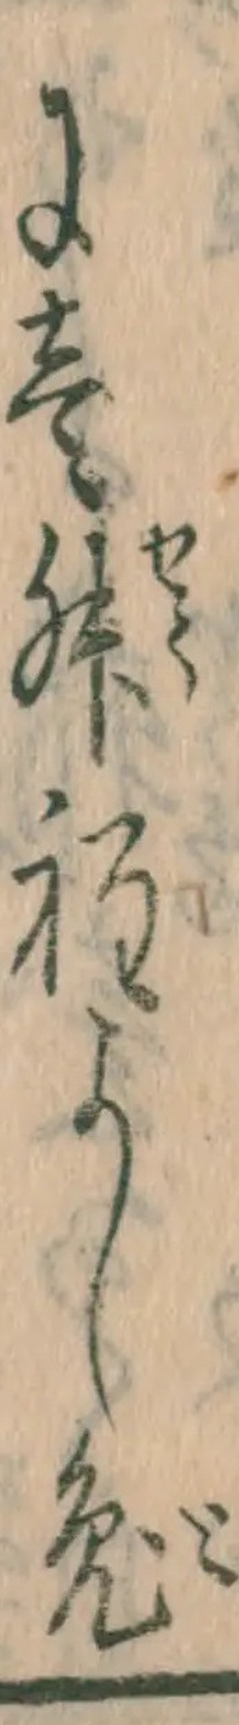に壱升程よし兎
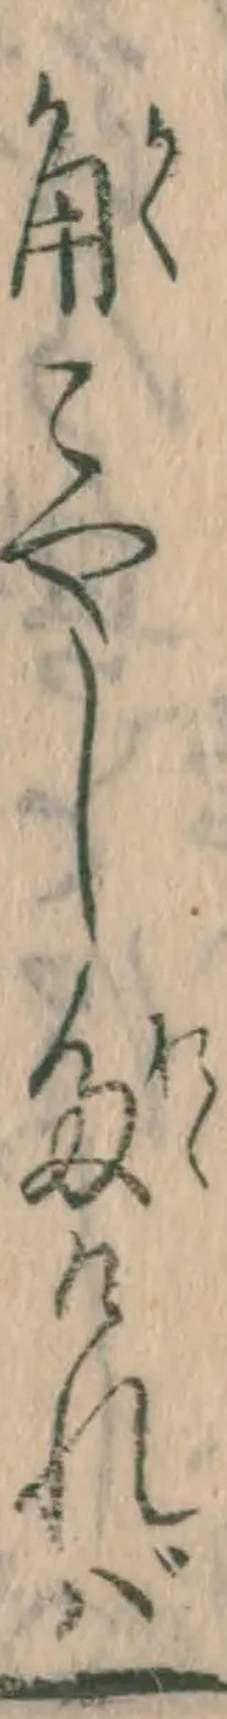角こやし多ければ
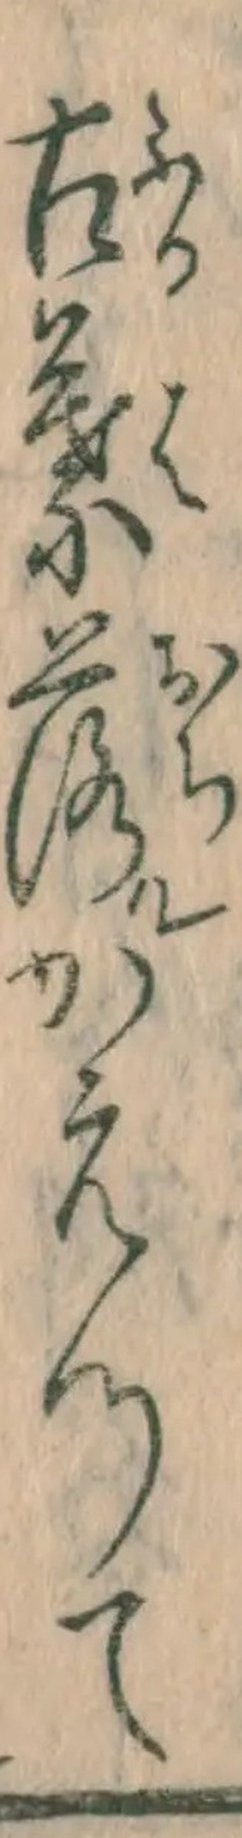古葉落
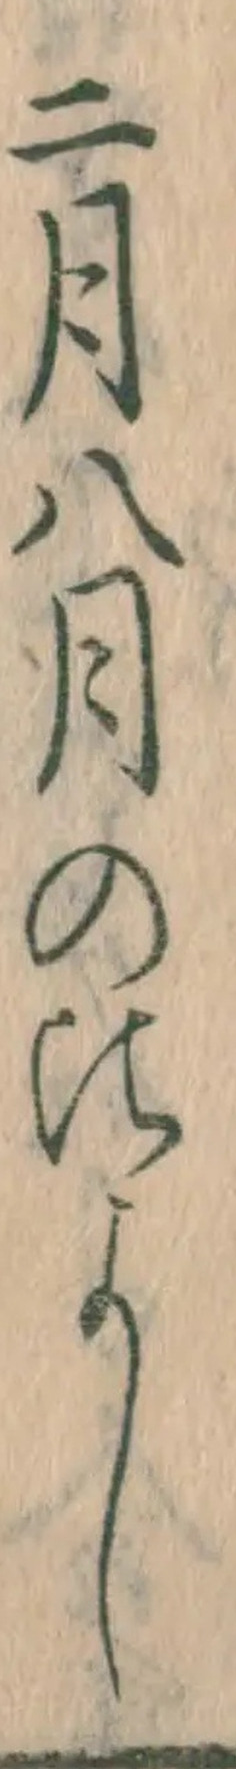二月八月の頃よし
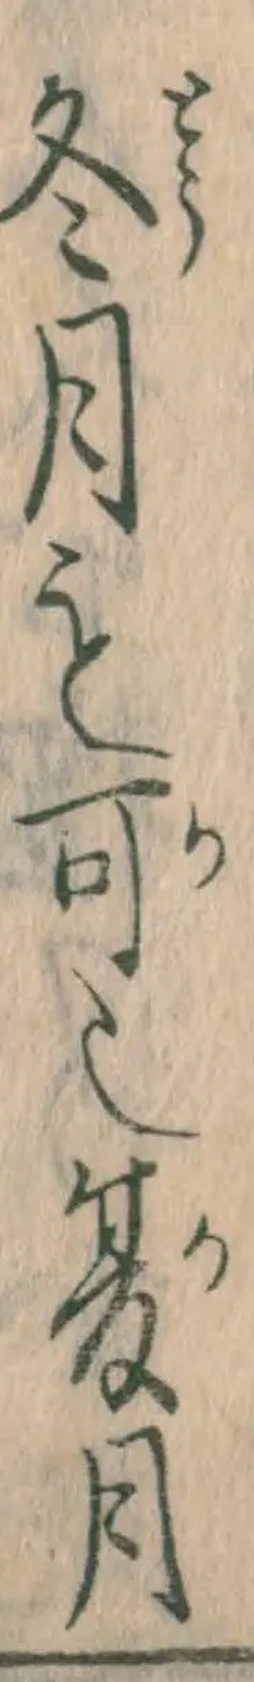冬月も可也夏月
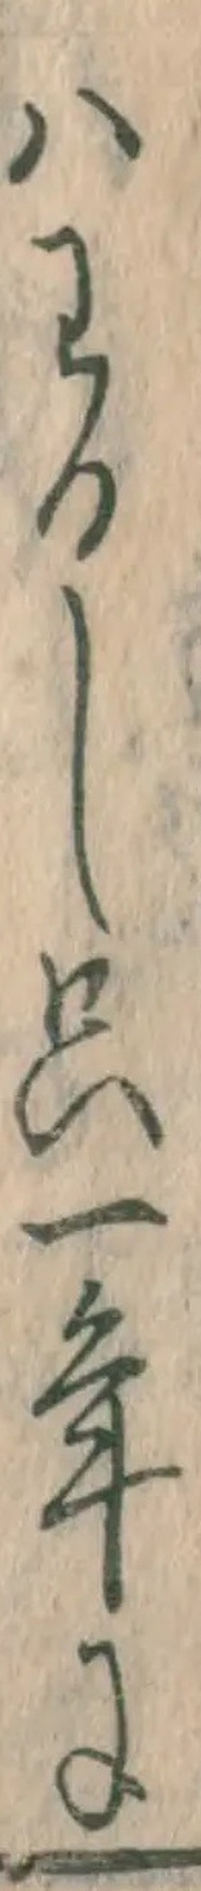はわるし只一年に
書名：錦繍枕 5巻. [5]
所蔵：国立国会図書館 National Diet Library, JAPAN
